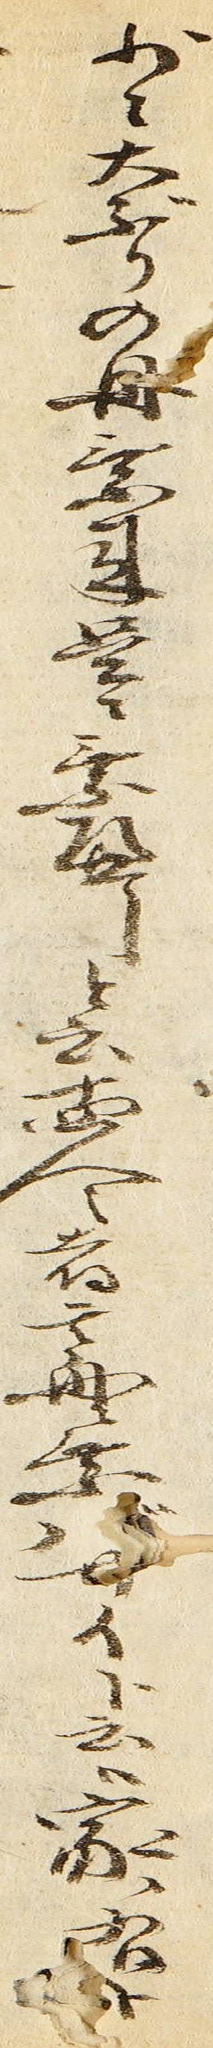少々大ぶりの舟乗来是に乗へしと言う云十四人之者其舟に乗バサイト云は家有と
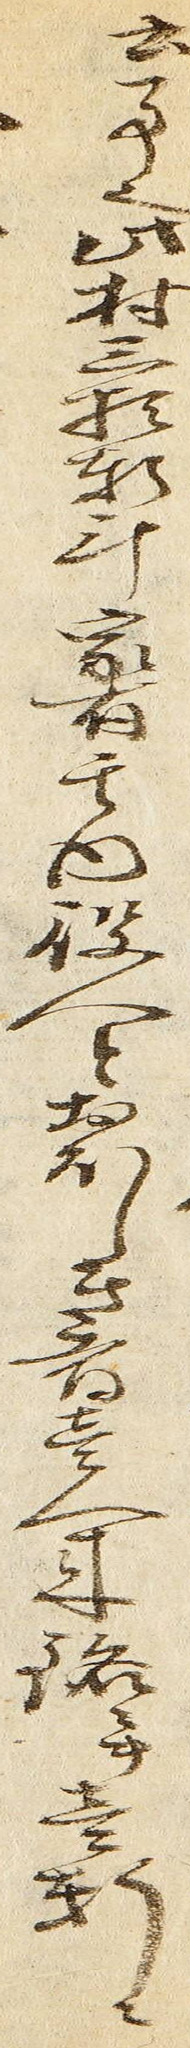云事也此村三拾軒計家有其内役人とおほしき者壱人来銘々を壱軒に
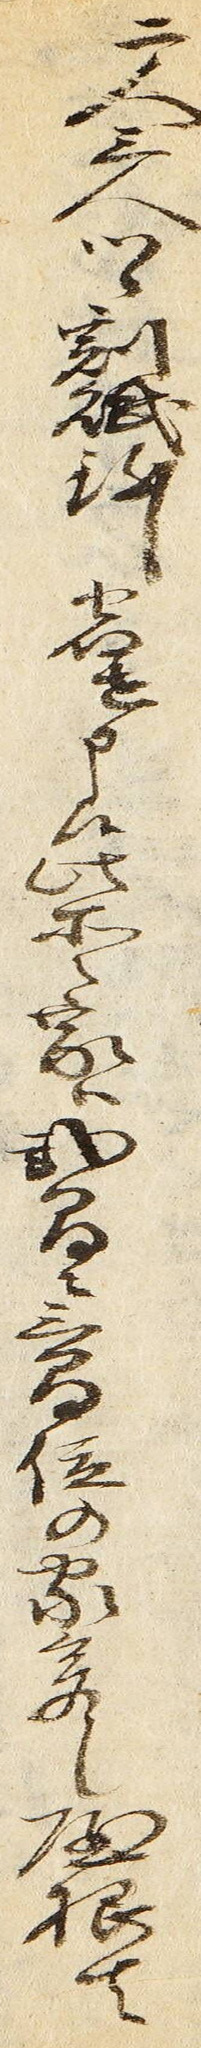二人三人つゝ割賦附宿を申候此所之家は弐間に三間位の家多し屋根は
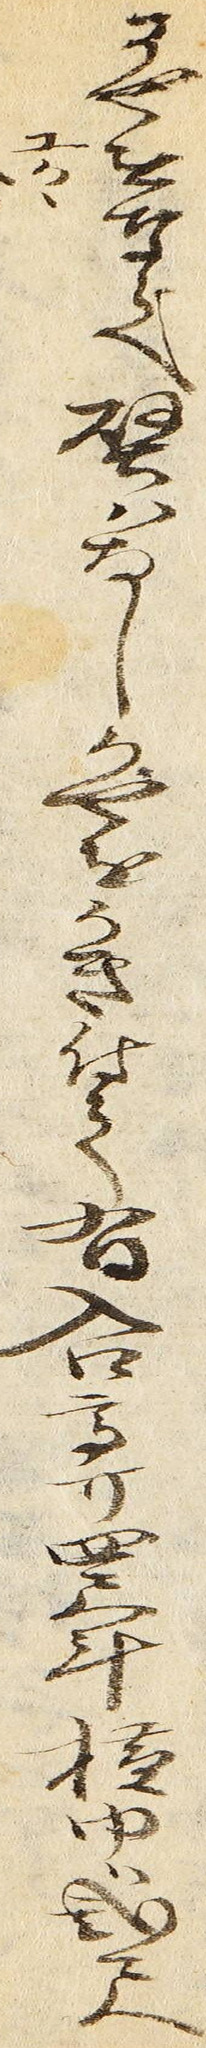かやをならへ壁はなしかやをかき付て有入口高さ四尺計横巾は弐尺
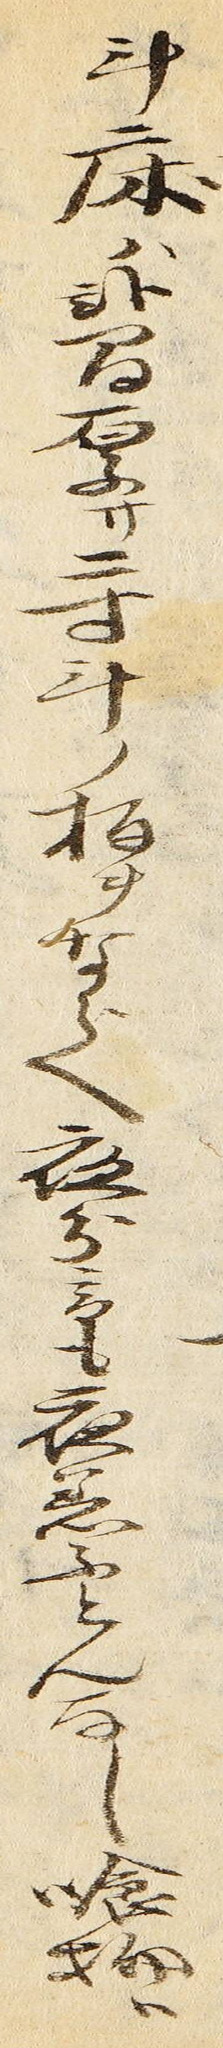計床は弐間厚さ二寸計の板をならへ夜分に而も夜着ふとんなし食物は
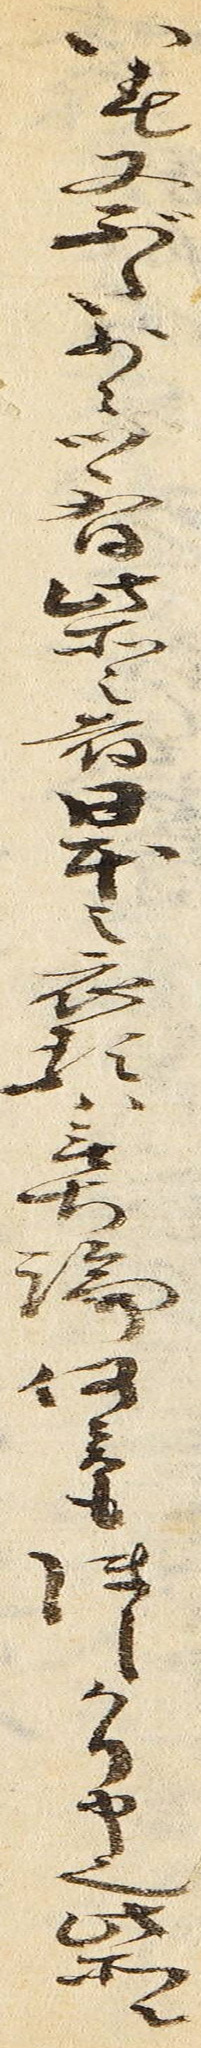いも又ぶた少々つゝ有此所之者日本之衣類はもち論何に而もほしかり申也此所に
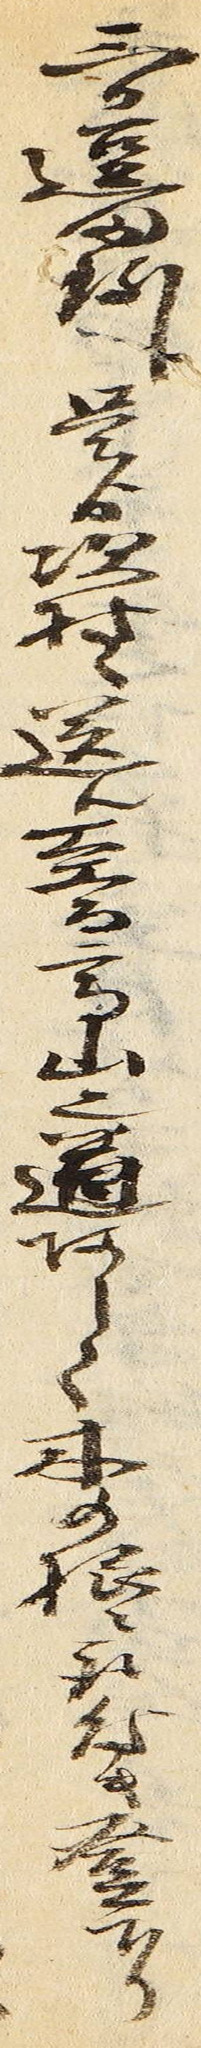三日逗留致し是ゟ次村へ送る至而高山也道あしく木の根に取付き登下り
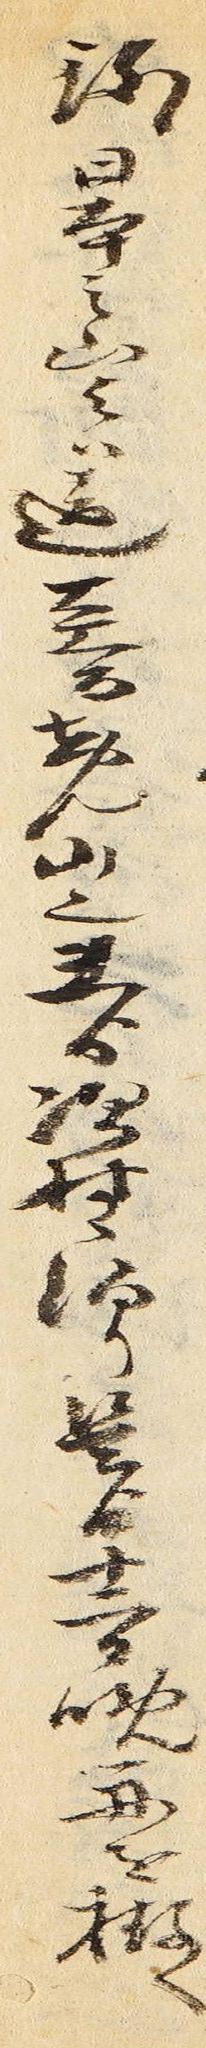致し日本之山とは違至而免山也夫ゟ次村へ泊り是ゟ十二日晩舟を拵へ
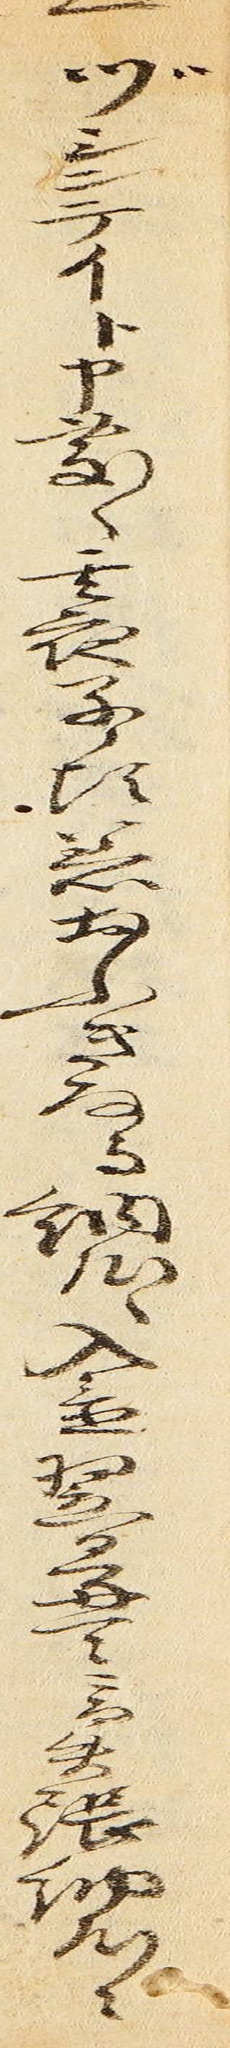ヅシンテイと申処へ其夜子の頃着おふきなる納屋へ入置翌日雨天に而矢張納屋に
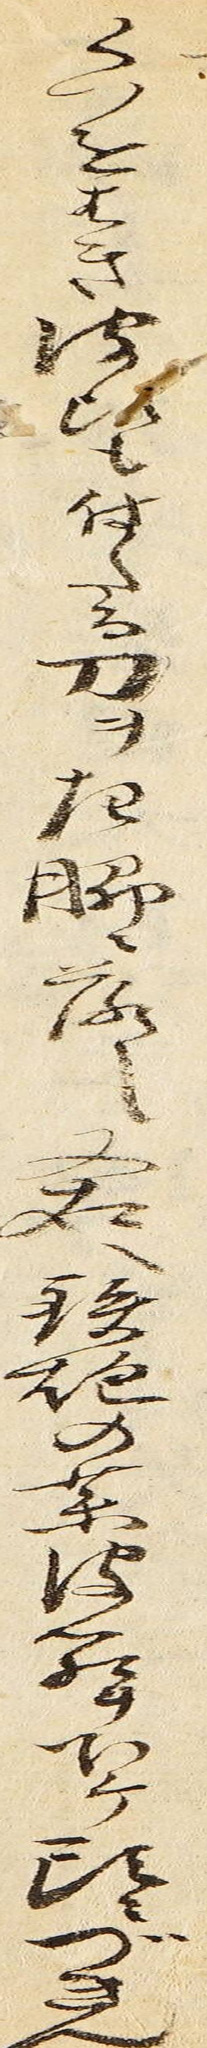くつをはき皮ひも付たる刀を左脇に落し又右へ鉄砲の薬皮籠を下け頭にづきん
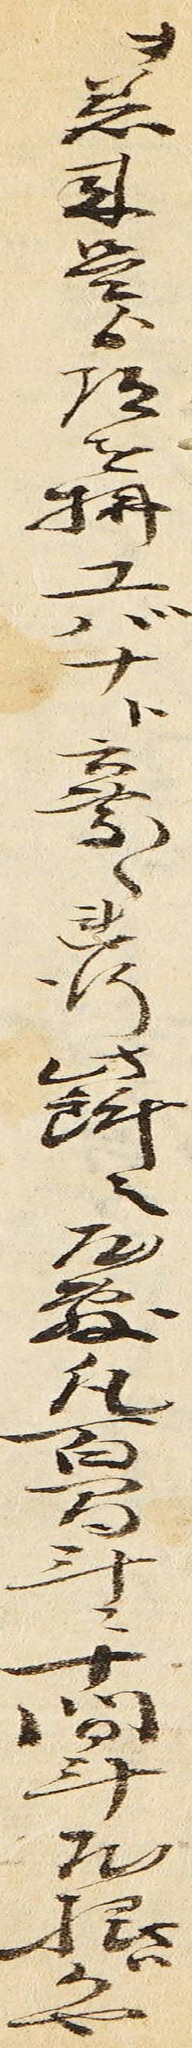を着来是ゟ道を払ユバナと云処へ連行此所之屋敷凡百間計に十間計屋根はかや
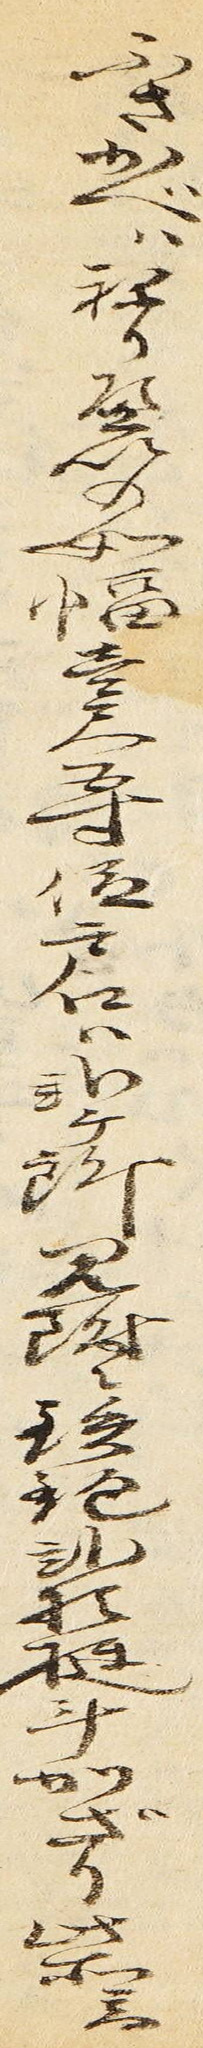ふきかべはねりへいの如幅壱尺五寸位戸口は弐ヶ所見附に鉄砲弐拾挺計かざり此所に而
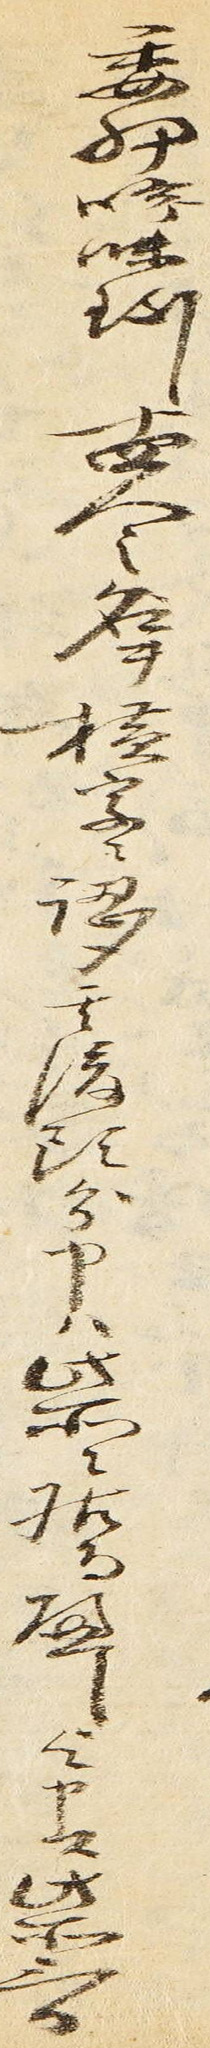委細吟味致し十四人之名を横字に認め其後頭分申は此所に居るへしと申候此所三日
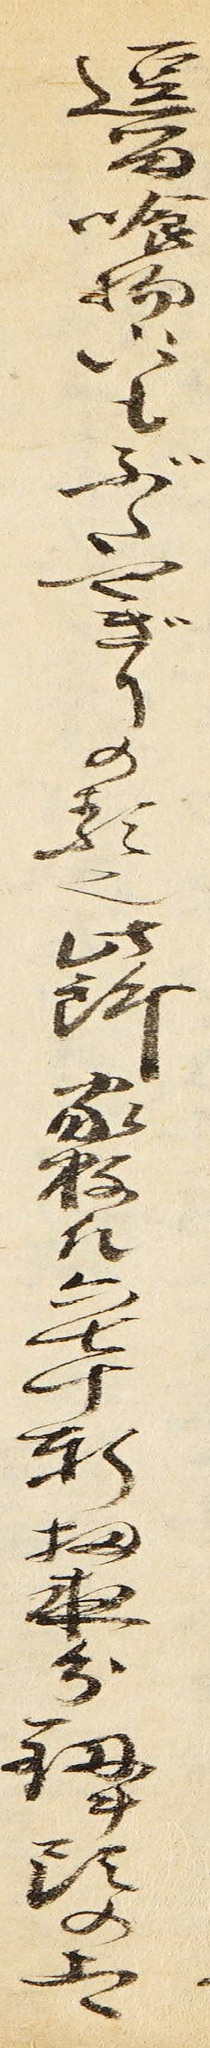逗留喰物はいもぶたやぎりの類也此所家数凡六七十軒扨夜分剱を頭
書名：漂流人物語記
